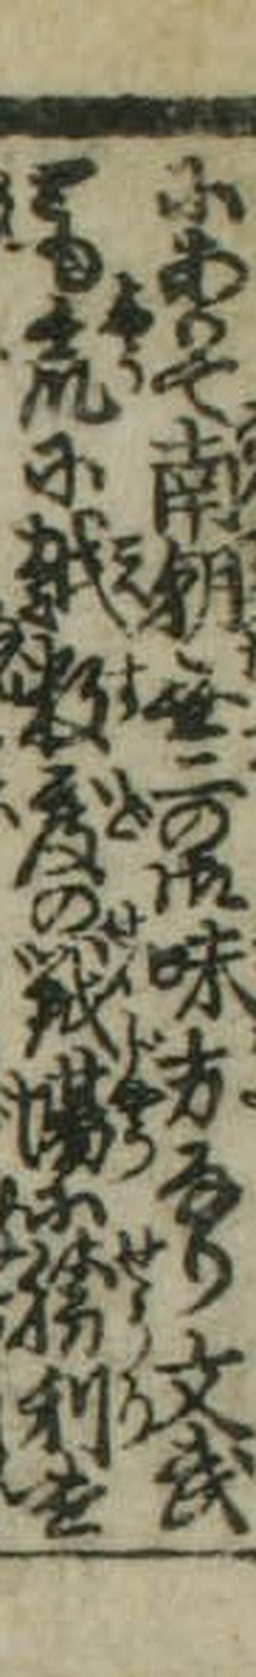とも衆に越数度の戦場に勝利を
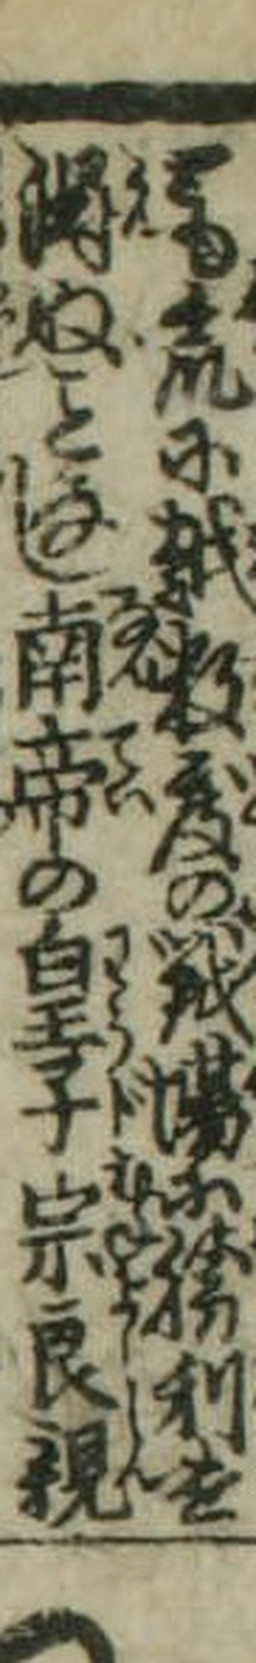得ぬことなし南帝の皇子宗良親
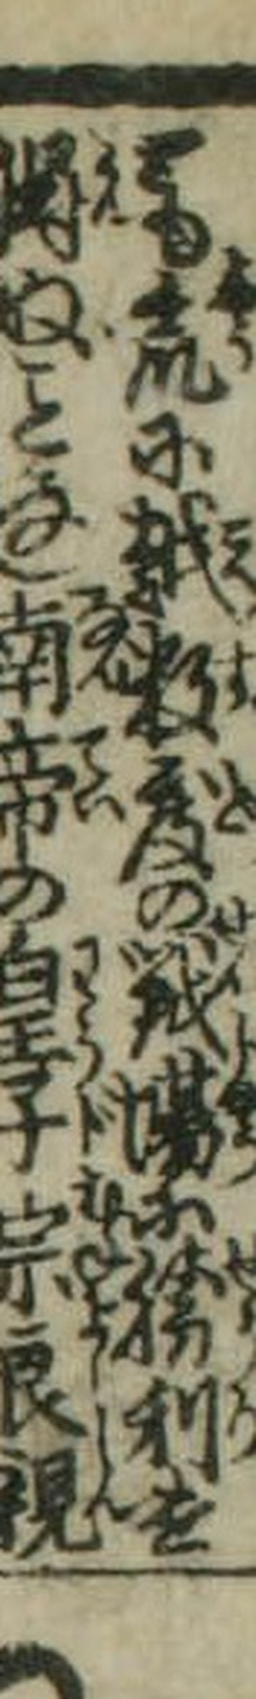得ぬことなし南帝の皇子宗良親
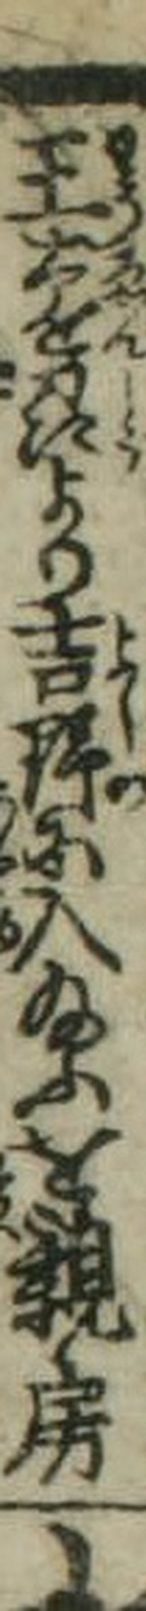王遠州より吉野に入給ふを親房
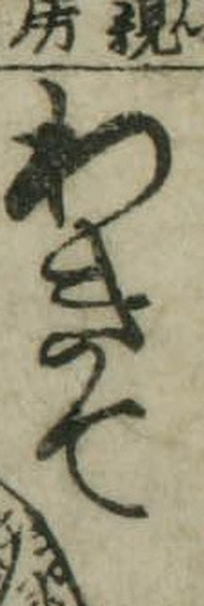わきて
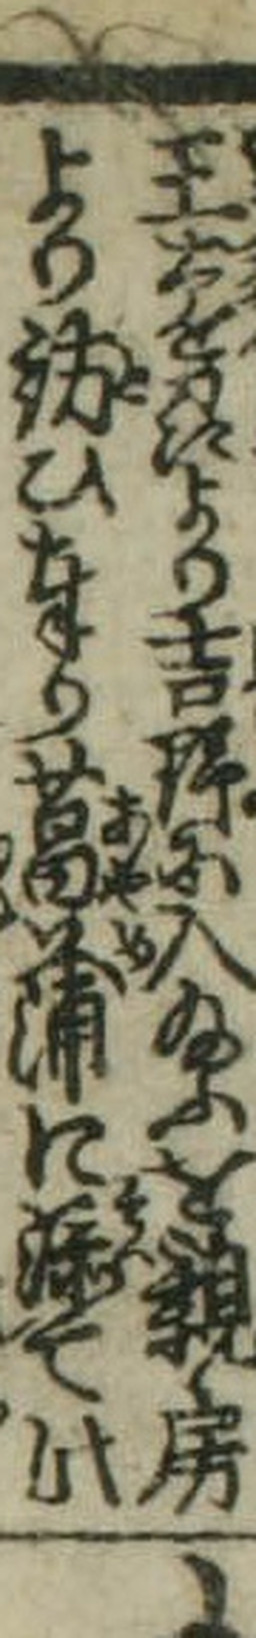より訪ひ奉り菖蒲に添て此
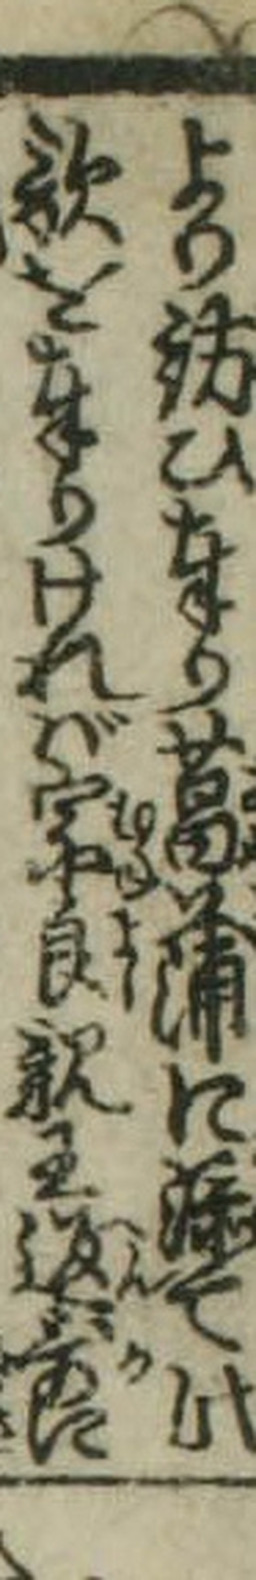歌を奉りければ宗良親王返哥に
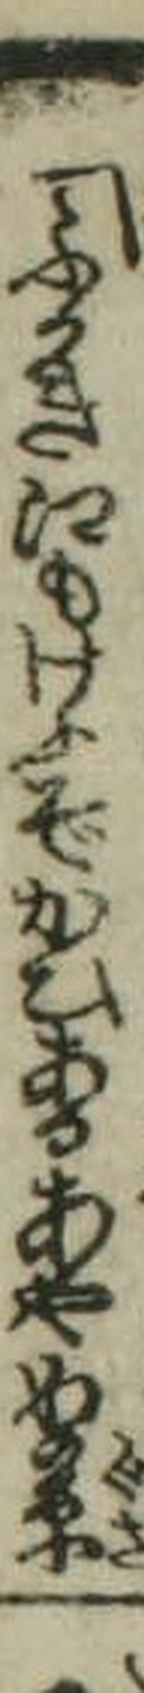〽ふかき江もけふぞかひあるあやめ草
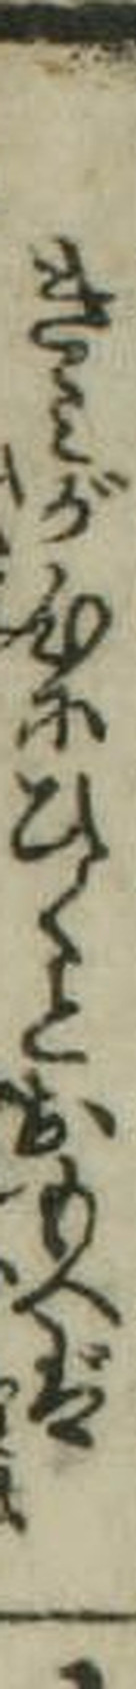きみが心にひくとおもへば
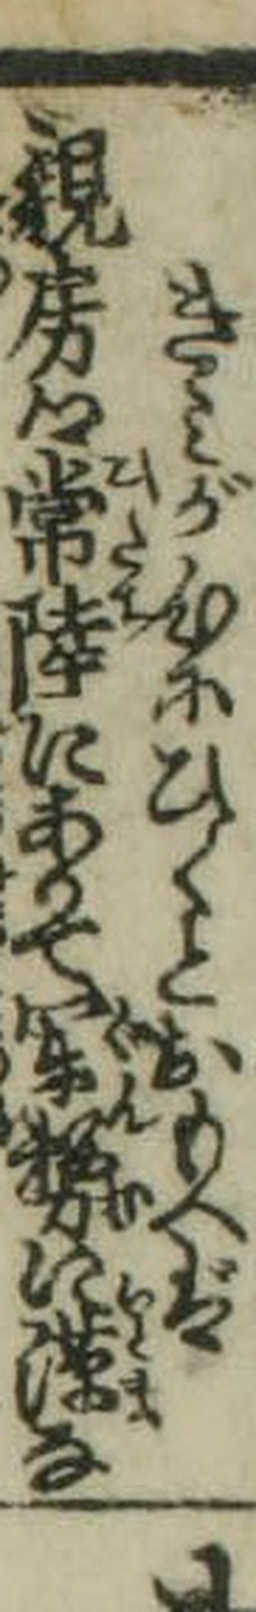親房卿常陸にありて軍務に隙な
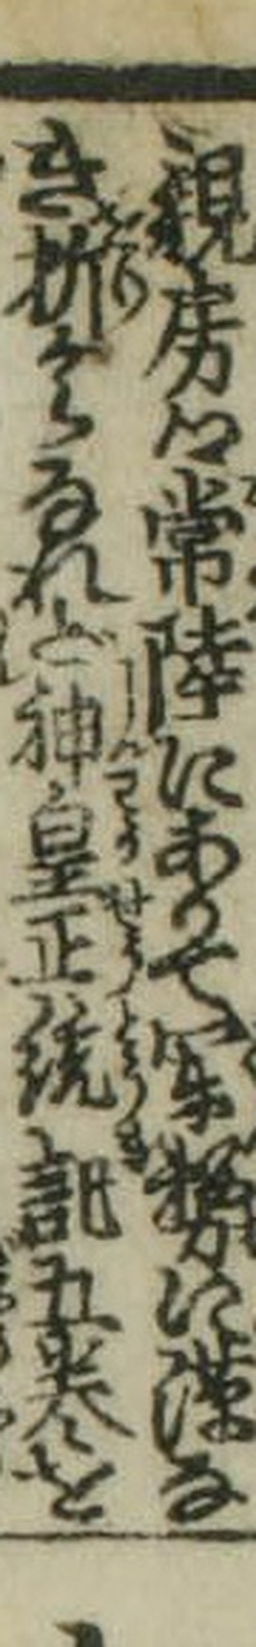き折からなれど神皇正統記五巻を
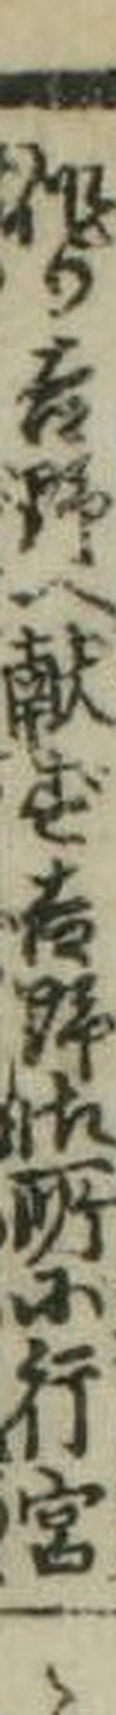作り吉野へ献ず吉野御所に行宮
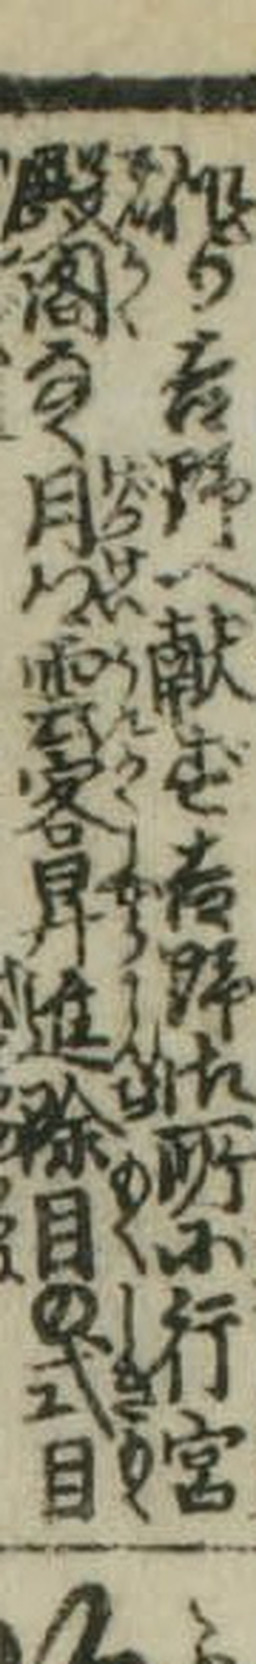殿閣なく月卿雲客昇進除目の式目
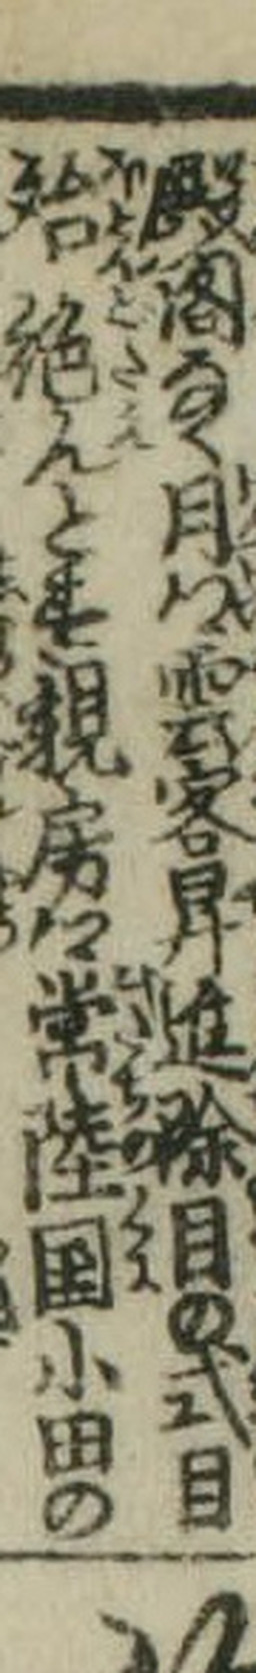殆絶んとす親房卿常陸国小田の
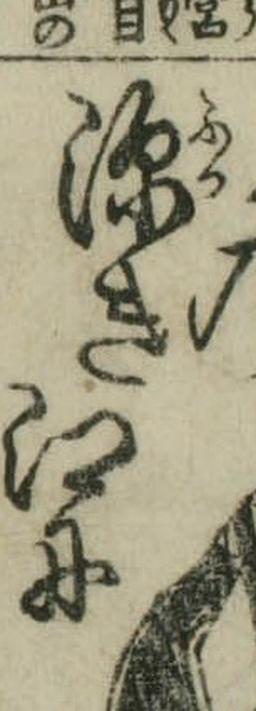深き江に
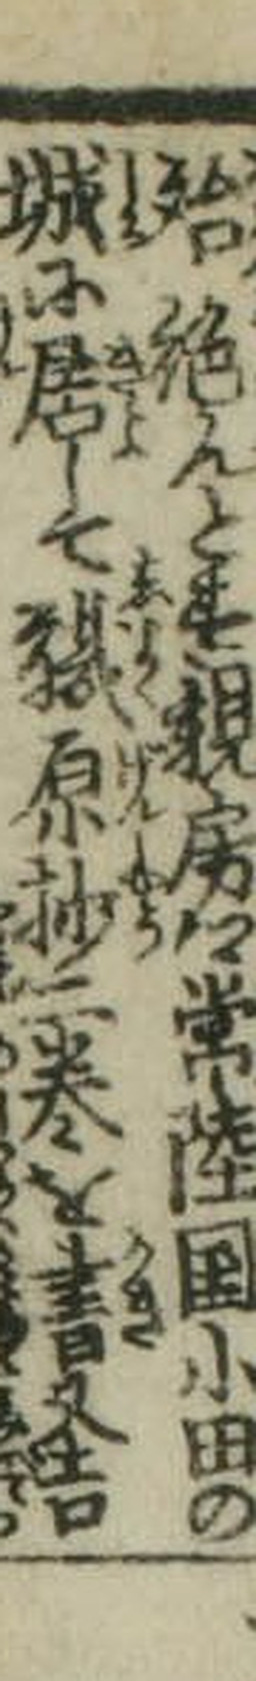城に居して職原抄二巻を書又吉
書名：續英雄百人一首
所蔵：東京学芸大学附属図書館
